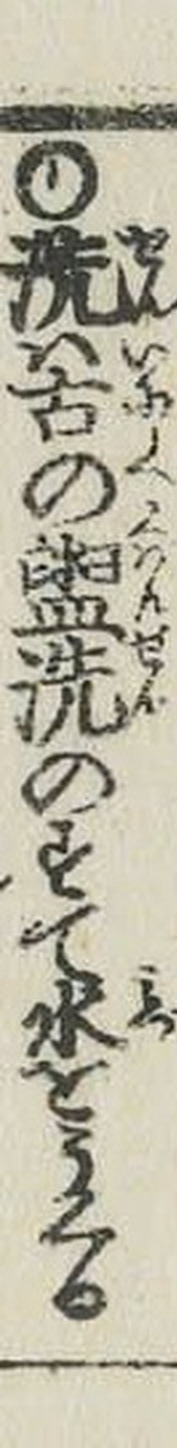○洗は古の盥洗のすて水をうくる
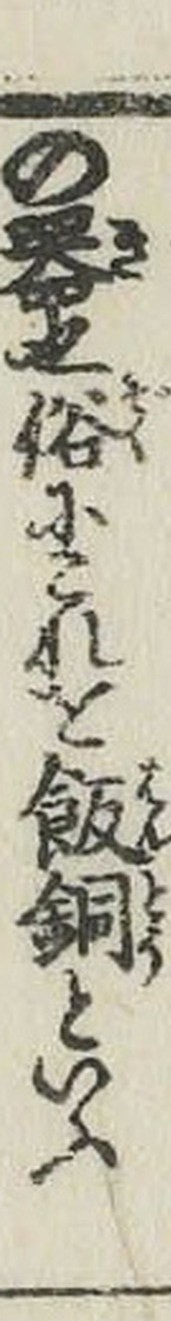の器也俗にこれを飯銅といふ
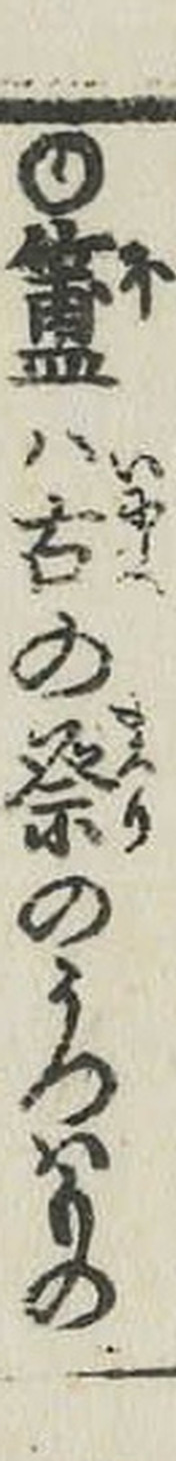○簠は古の祭のうつはもの
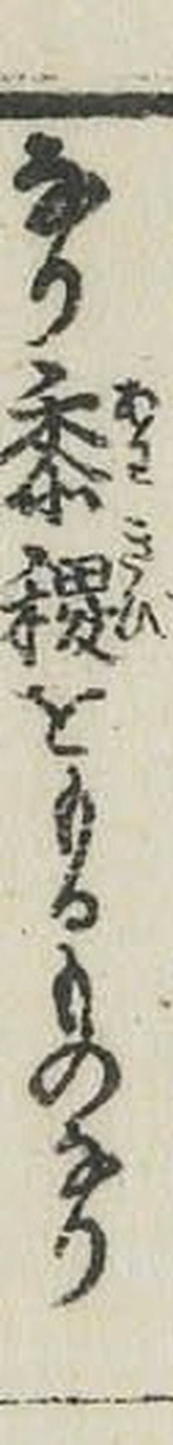なり黍稷をもるものなり
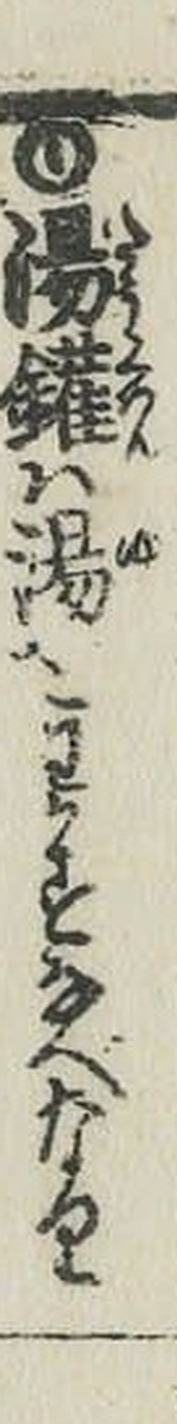○湯鑵は湯をわかすなべなり

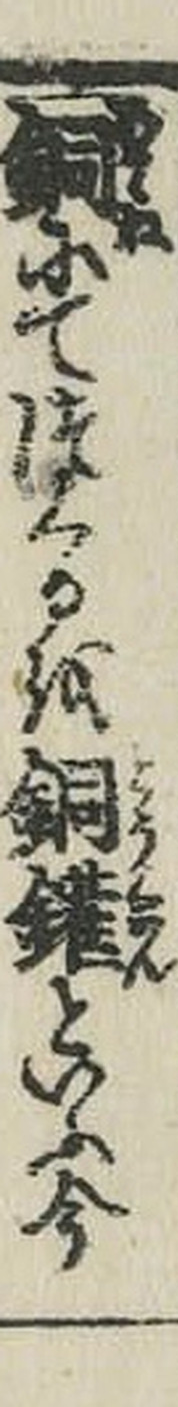銅にてつくるを銅鑵といふ今
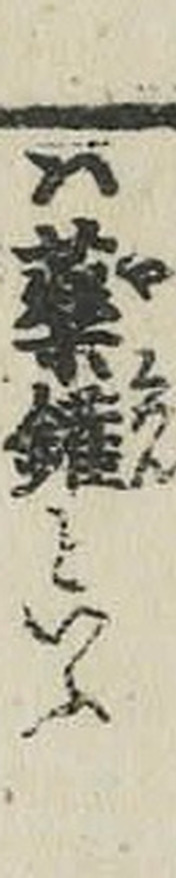は薬鑵といふ
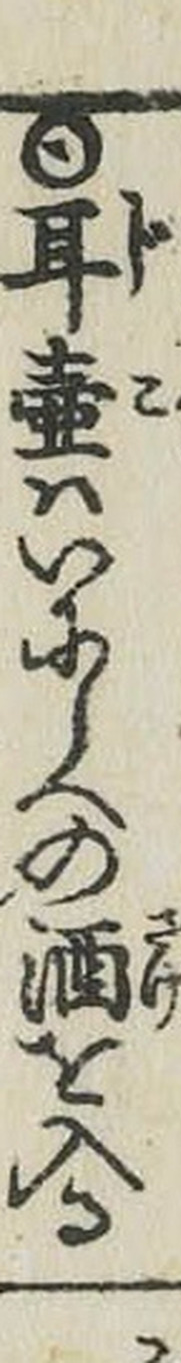○耳壺はいにしへの酒を入る
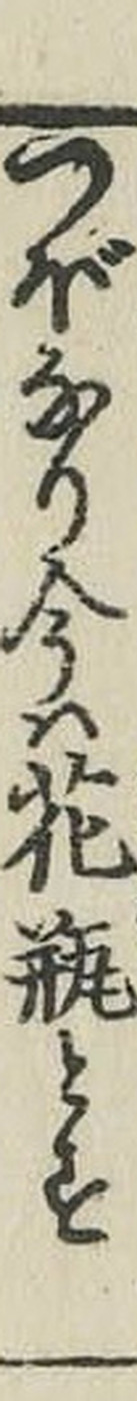つぼなり今は花瓶とす
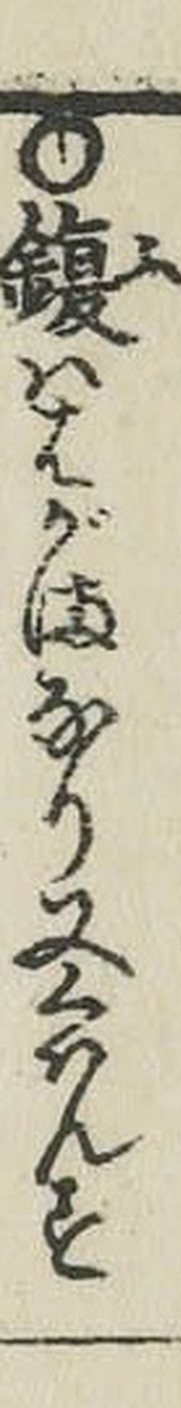○鍑ははがまなり又くはんす
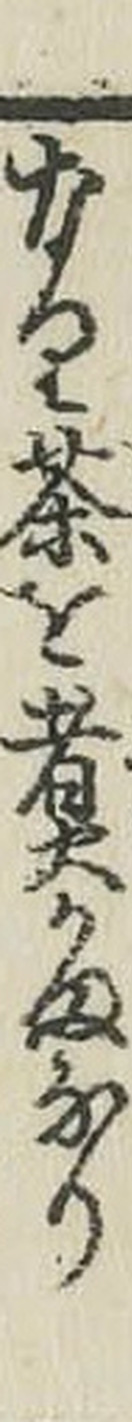なり茶を煮かまなり
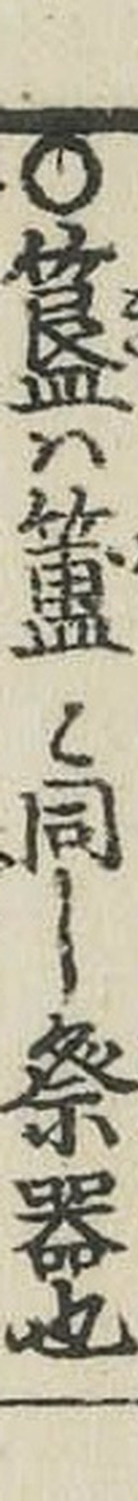○簋は簠と同し祭器也
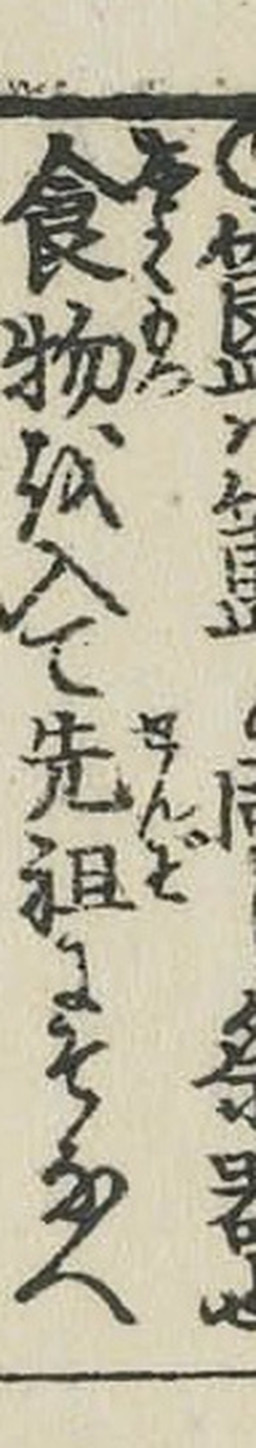食物を入て先祖にそなへ
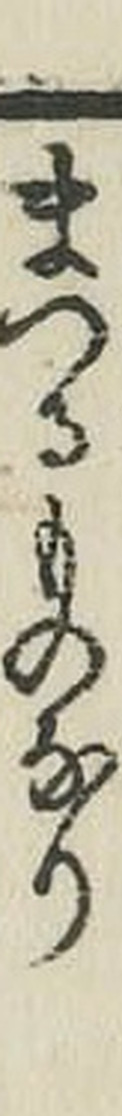まつるものなり
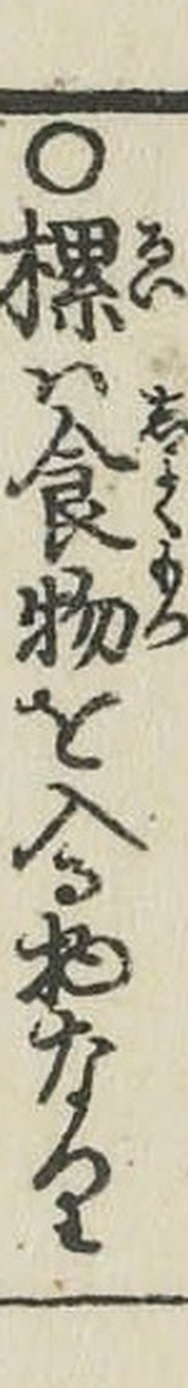○樏は食物を入る物なり
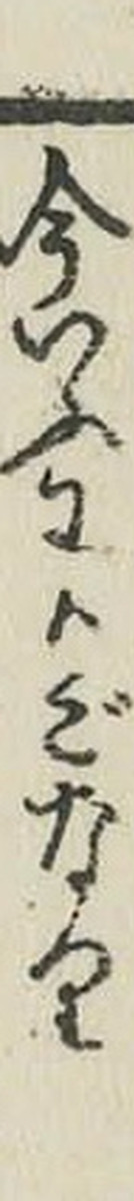今いふわりごなり
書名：増補頭書訓蒙図彙大成 10巻 5:巻之9-11
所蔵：東京学芸大学教育コンテンツアーカイブ
